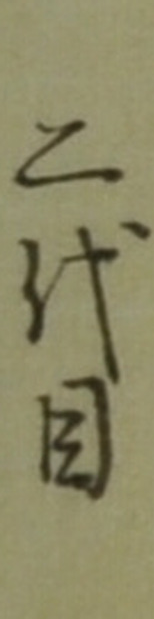二代目
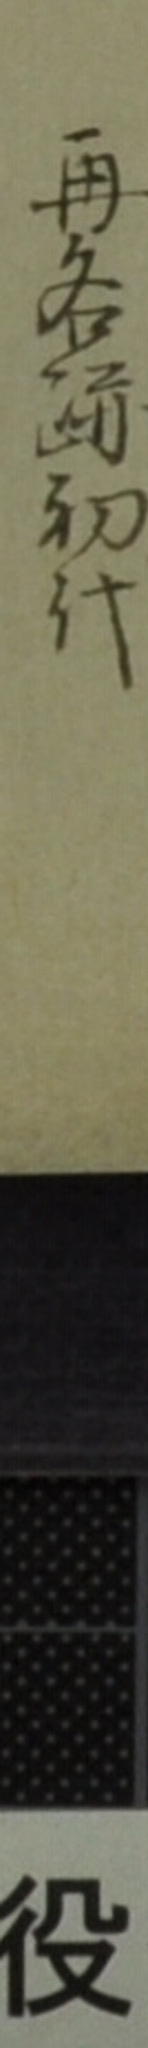再名跡初代
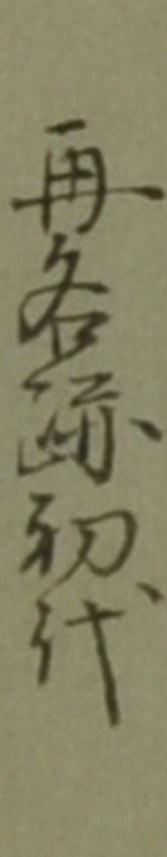再名跡初代
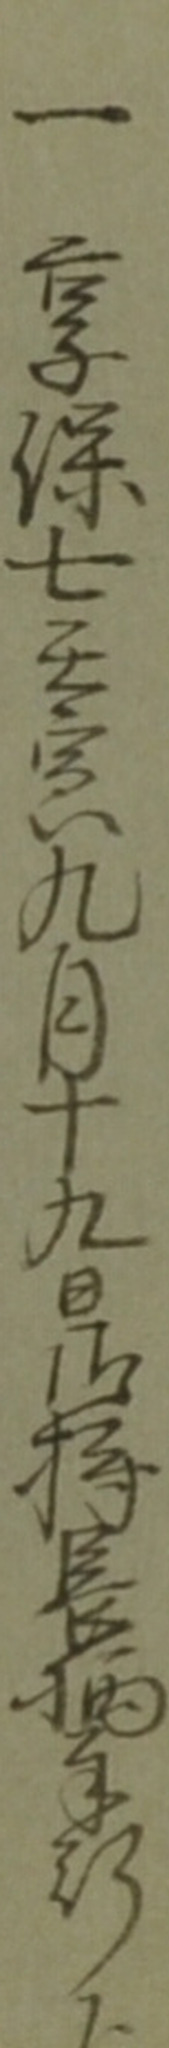一享保七壬寅九月十九日御持長柄奉行ゟ
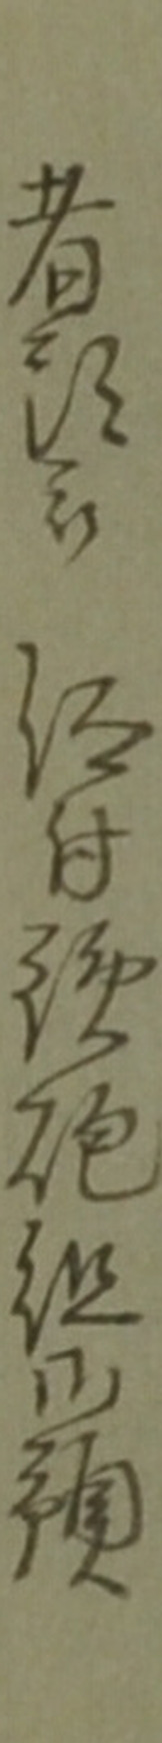者頭被仰付鉄砲組御預
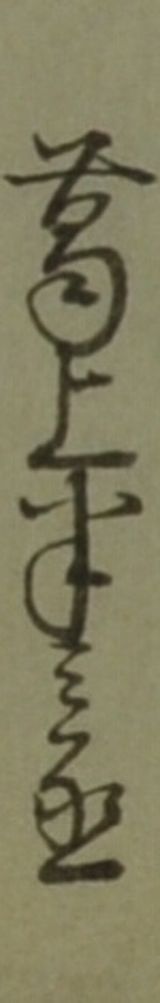葛上半之丞
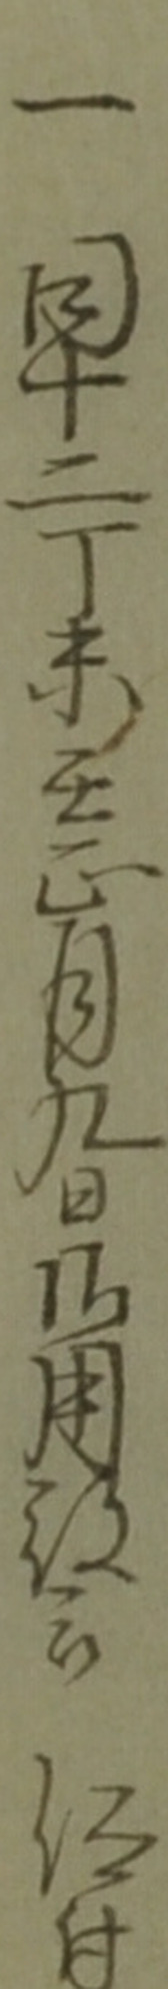一同十二丁未閏正月九日御用役被仰付
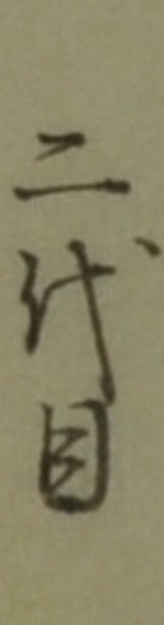二代目
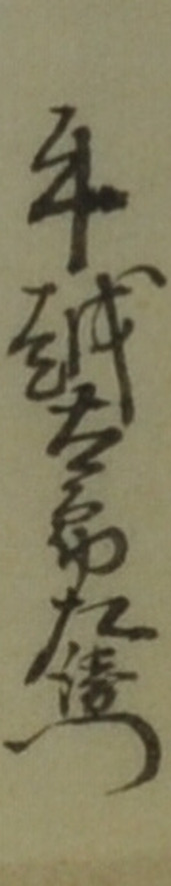牛越太郎左衛門
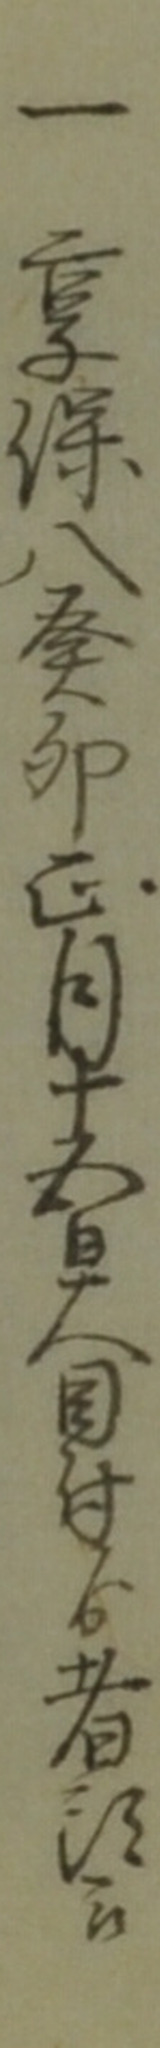一享保八癸卯正月十五日大目付ゟ者頭被
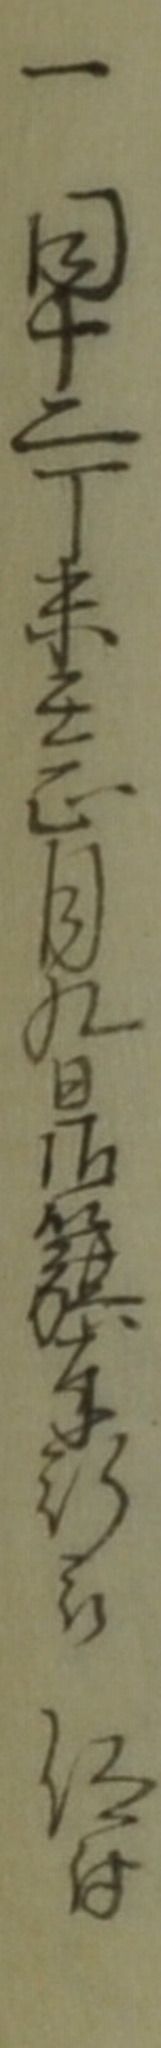一同十二丁未閏正月九日御籏奉行被仰付
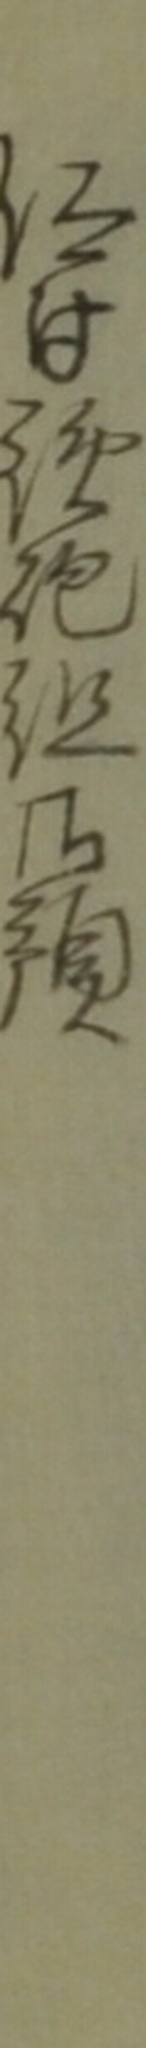仰付鉄砲組御預
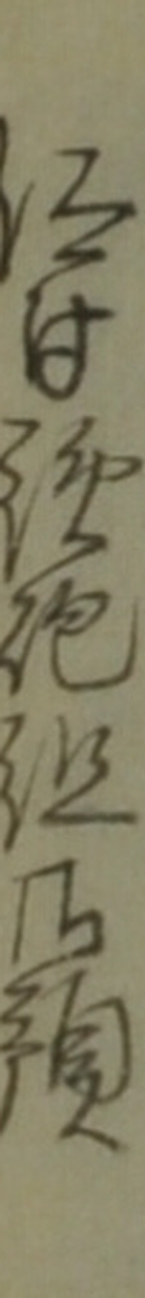仰付鉄砲組御預
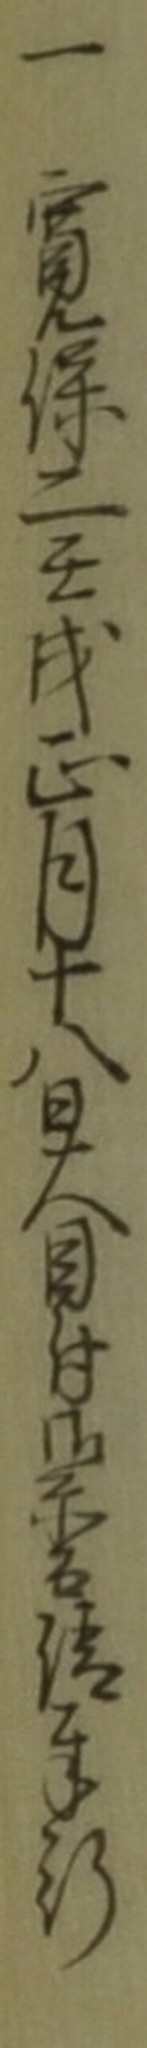一寛保二壬戌正月十八日大目付御普請奉行
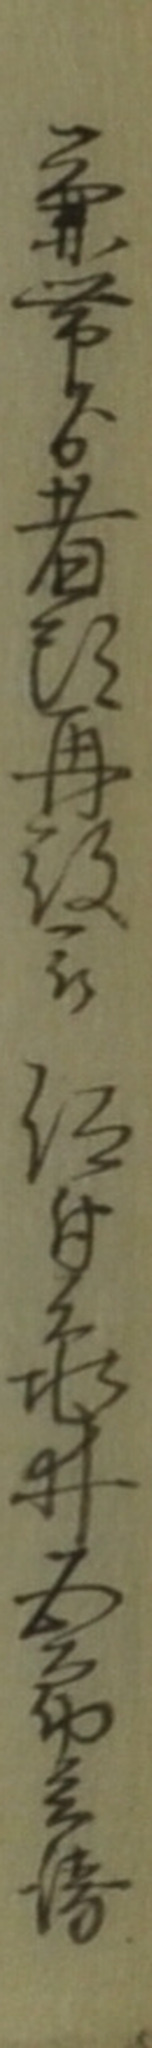兼帯ゟ者頭再役被仰付亀井五郎兵衛
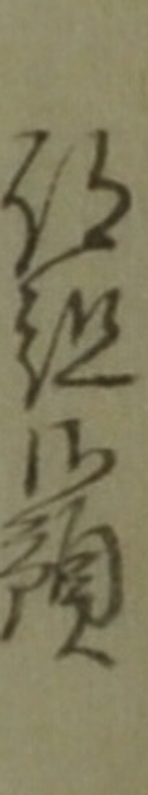跡組御預
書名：諸御役代々録（二）
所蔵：伊那市立高遠町図書館・合同会社AMANE
